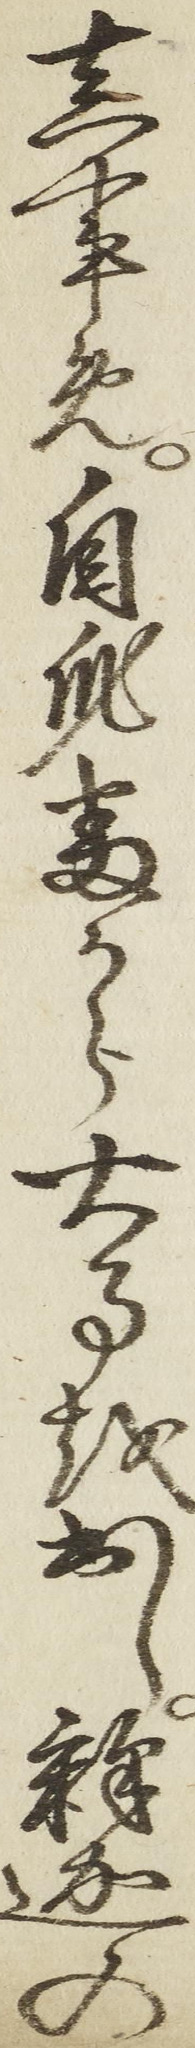真事め。自身番から火事を出し。釋迦の

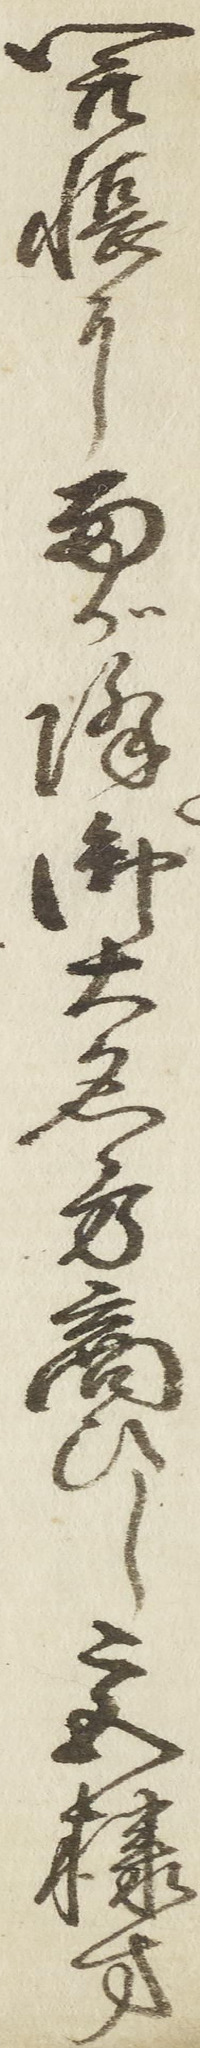開帳に雨が降。御大名方商ひし宮様方
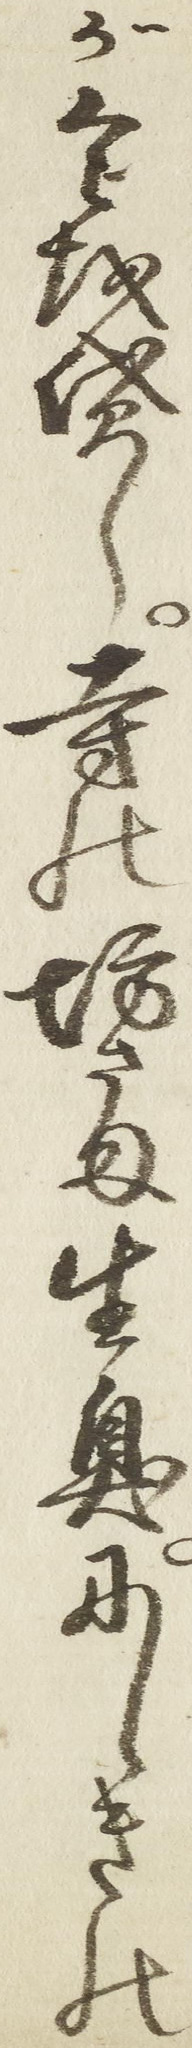がくらを貸し。寺の坊さま生臭。にしきの
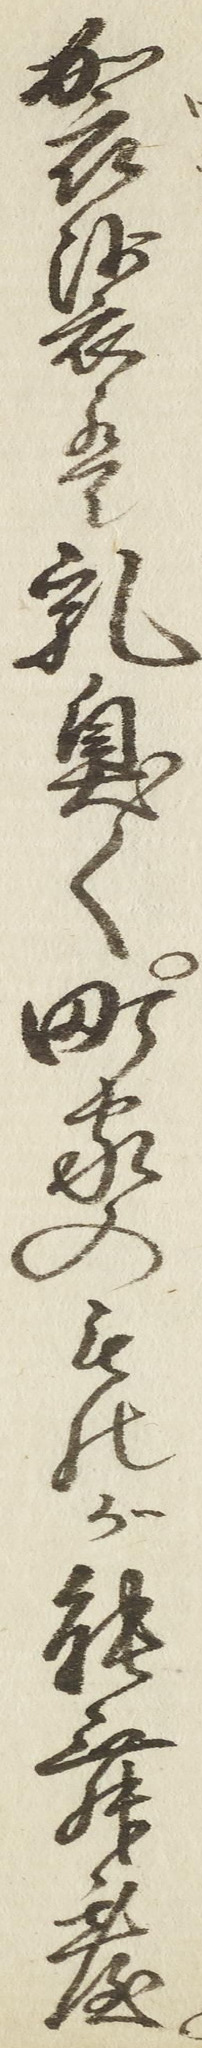袈裟は乳臭く。町家のものが能舞台。
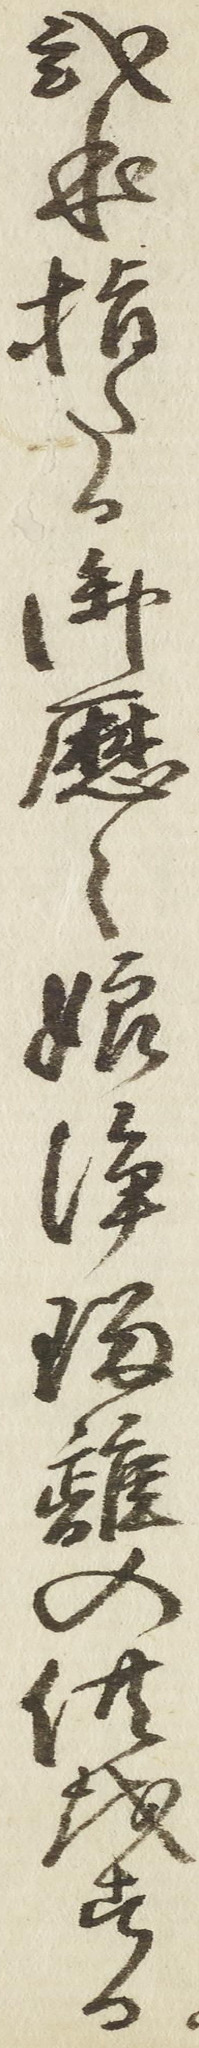弐本指たる御歴之娘浄瑠璃の供をする。
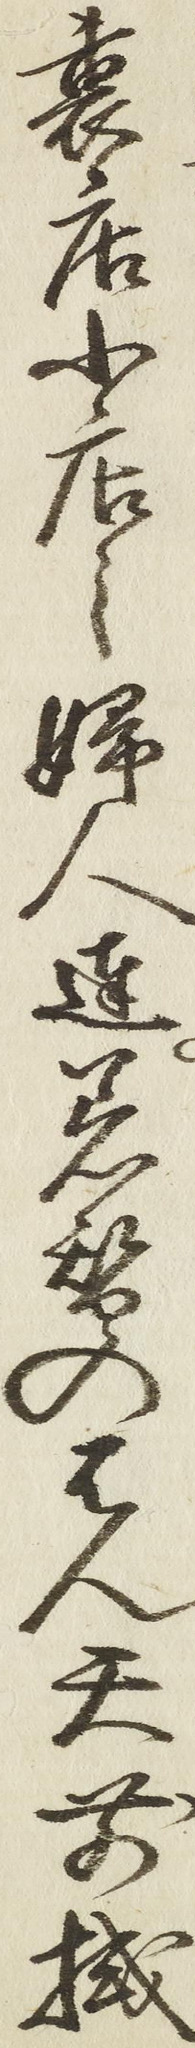裏店小店之婦人達。着替のはん天前掛
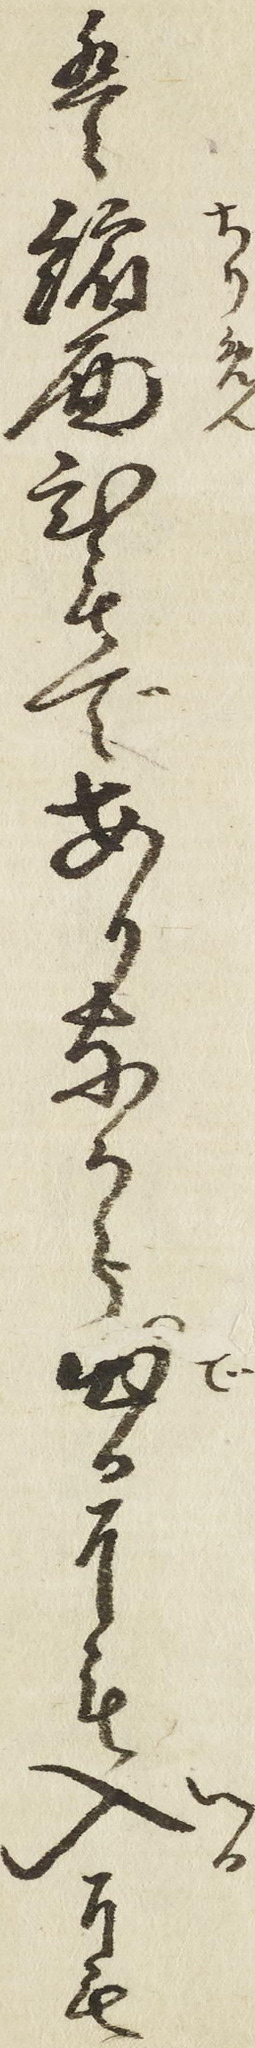は縮緬ひもでありなから。出るにも入にも
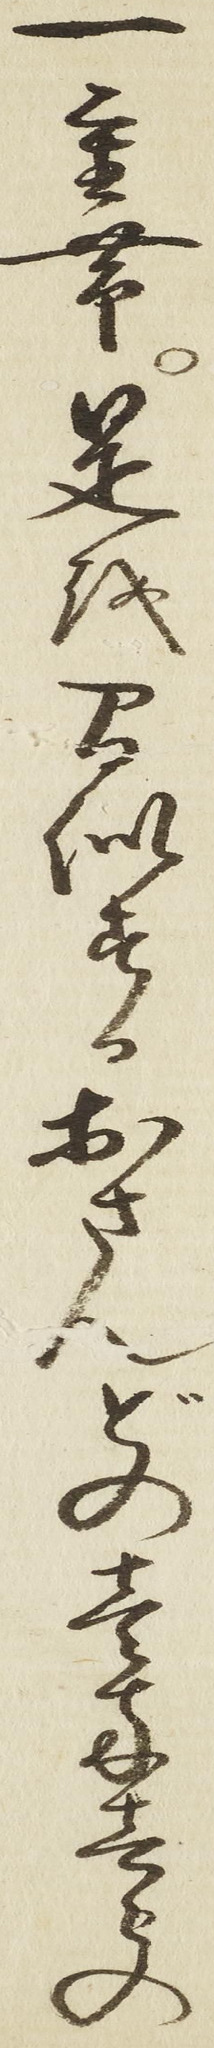一重帯。是を間似するおさんどのはなはもの
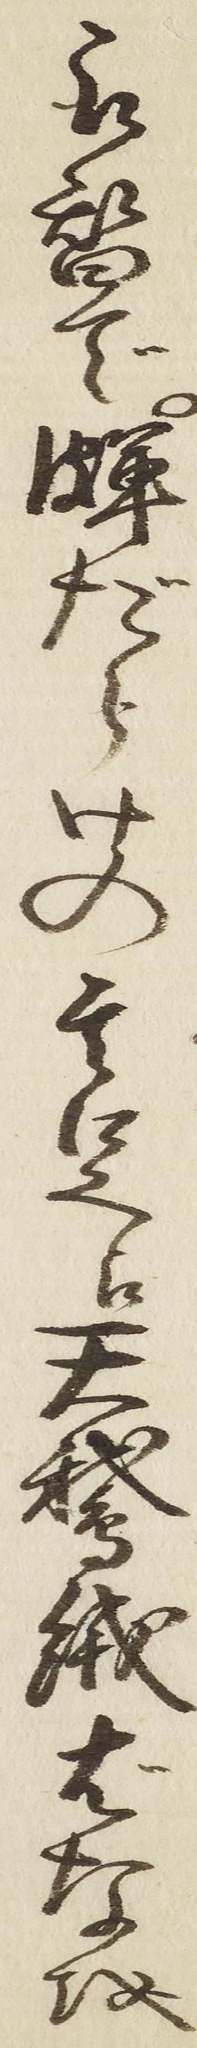取替で。皹だらけの其足江天鵞縅ばなを
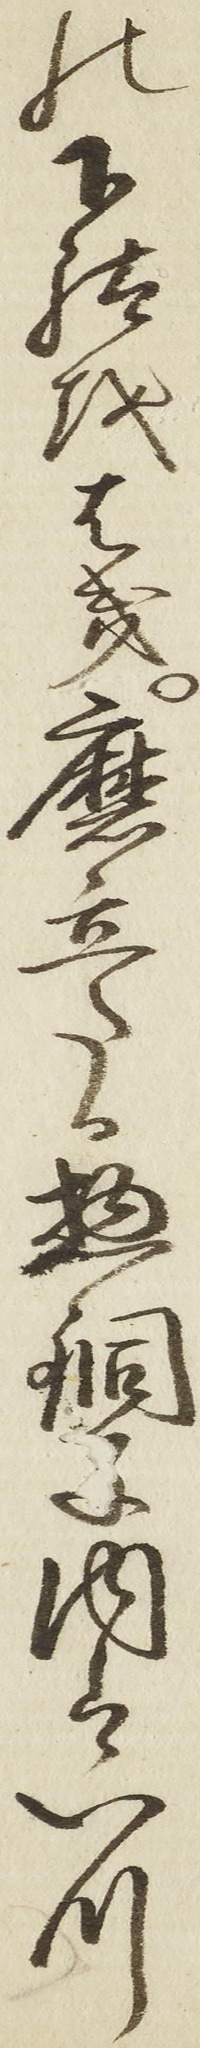の下駄をはき。磨立たる惣銅子内はいつ
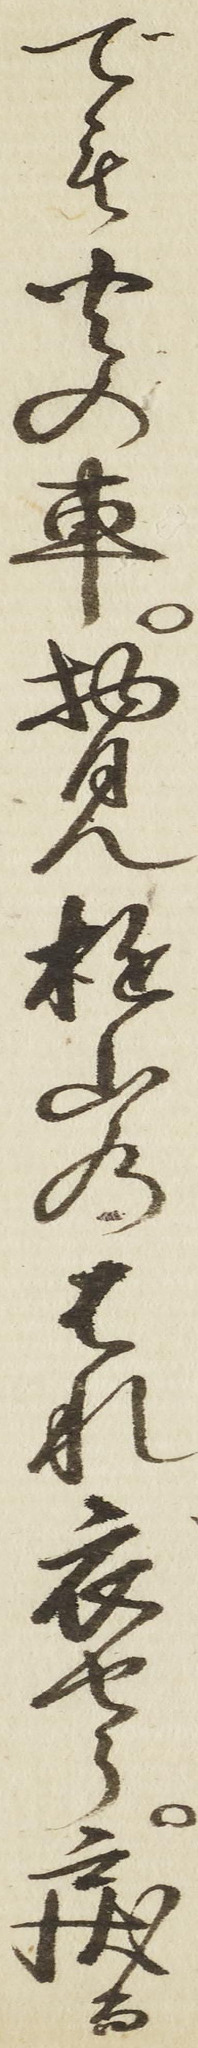でも火の車。物見遊山のはれ衣せう。戻而
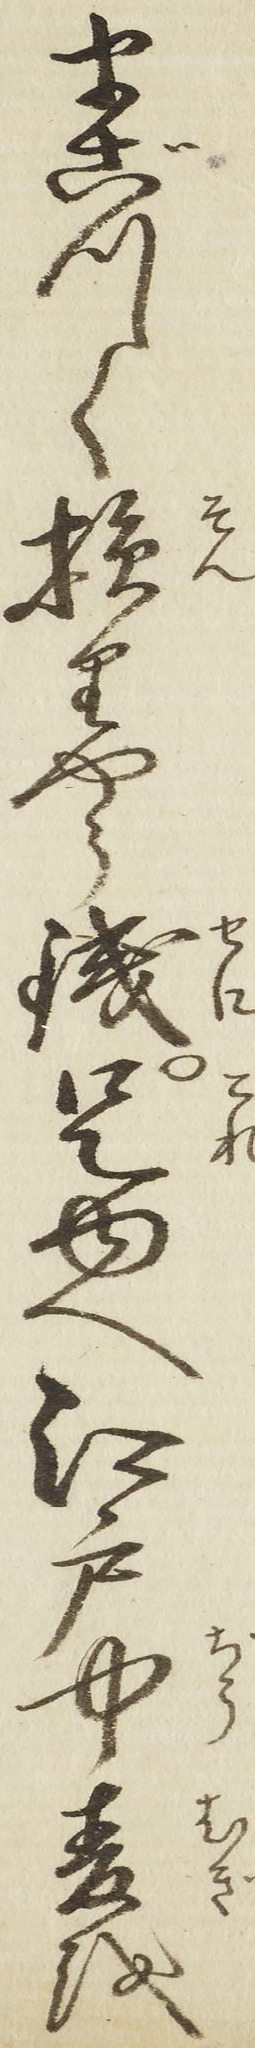まごつく損りやう銭。是ゆへ江戸中麦を
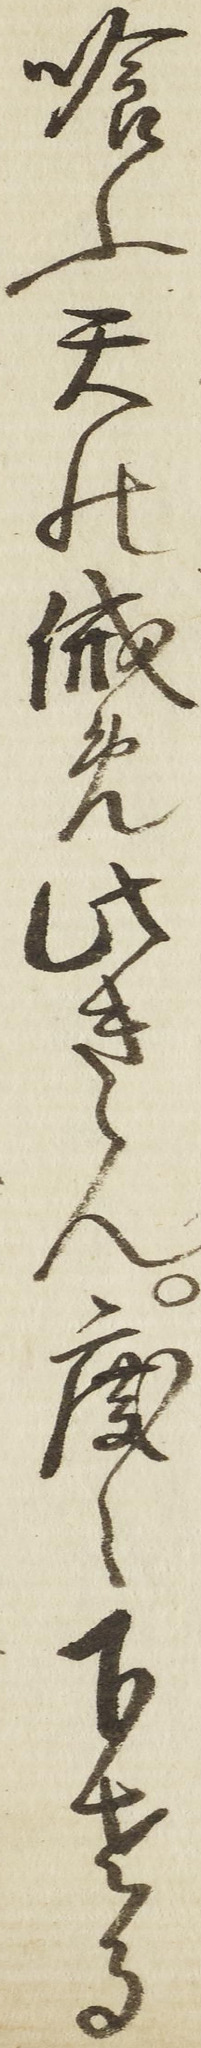喰ふ天の戒め此きゝん。度〳〵下さる

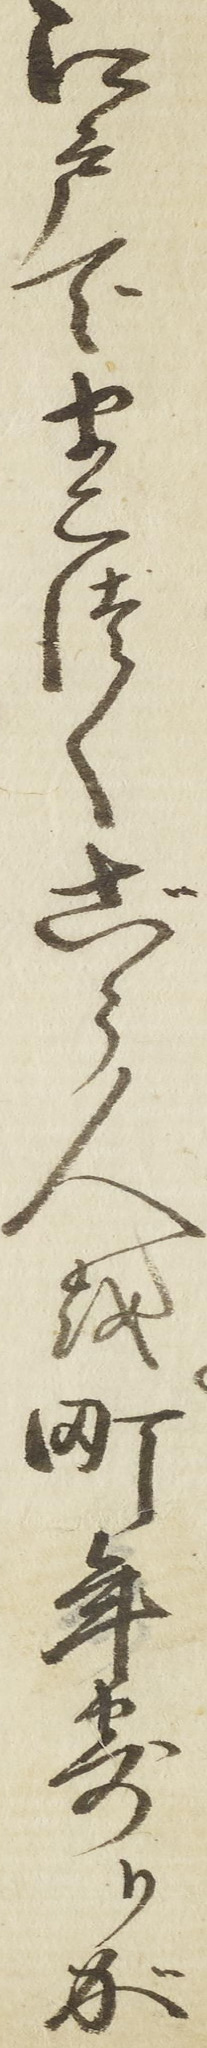江戸でまごつくごう人を。町年寄りが
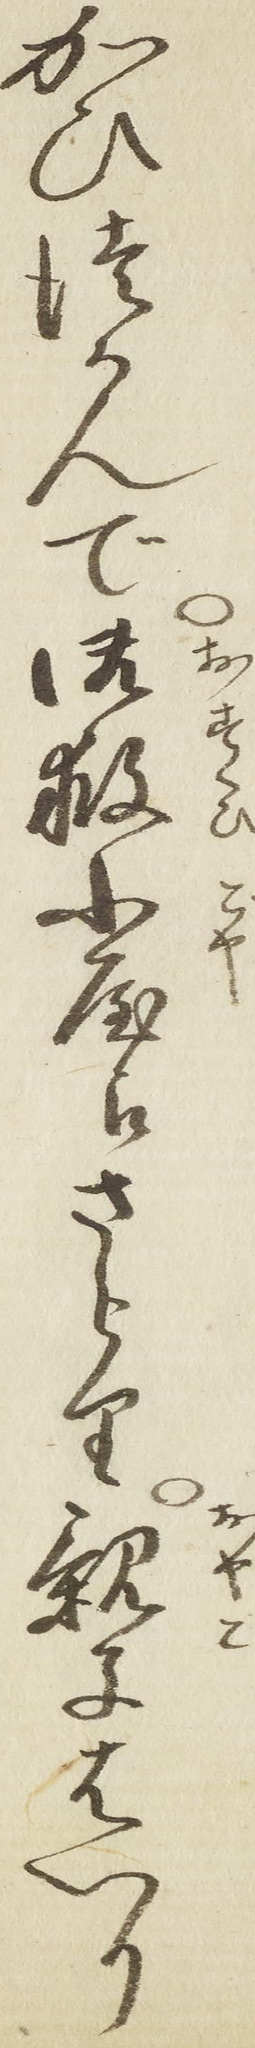かひつかんで。御救小屋江さらり。親子はいり
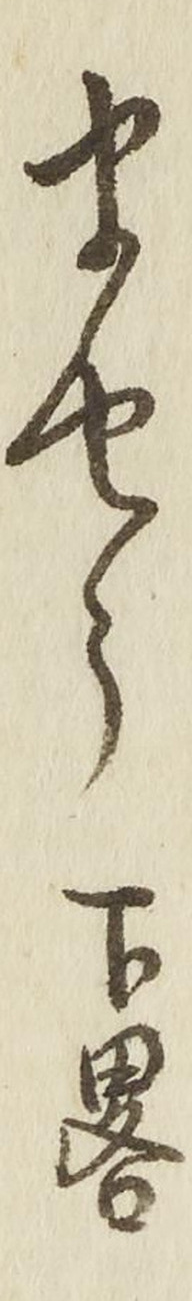ませう下畧
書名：天保佐久　滑稽茶利集記
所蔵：東京大学地震研究所図書室 Earthquake Research Institute Library, The University of Tokyo, JAPAN
